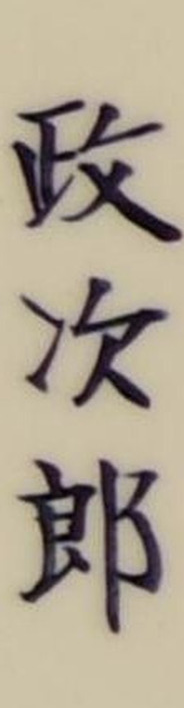政次郎

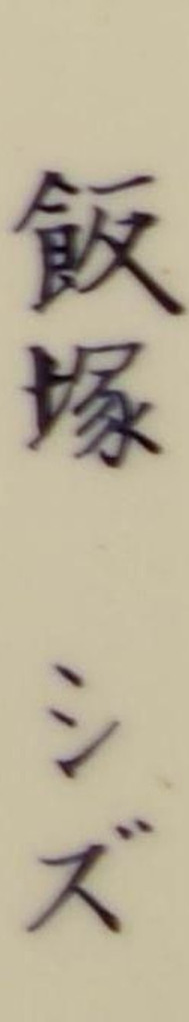飯塚シズ
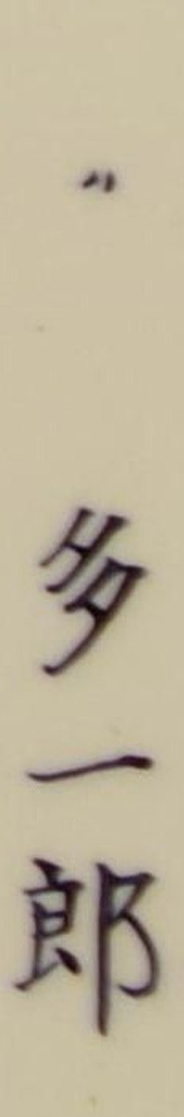多一郎
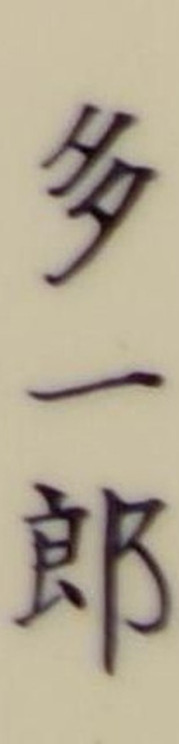多一郎
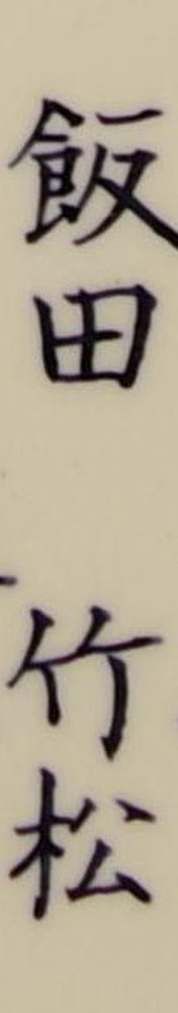飯田竹松
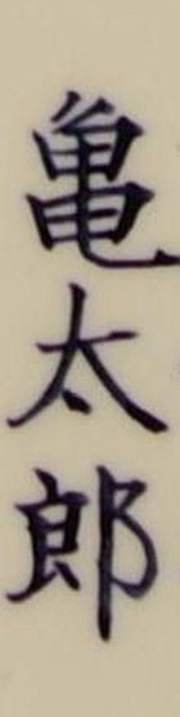亀太郎

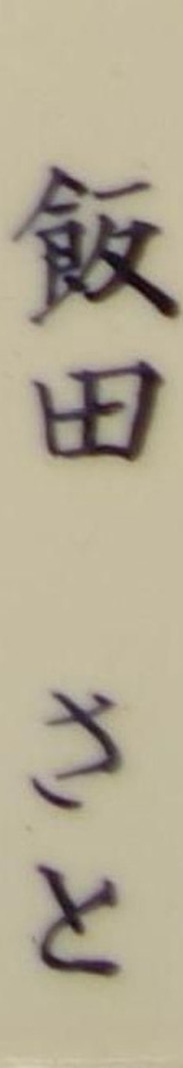飯田さと
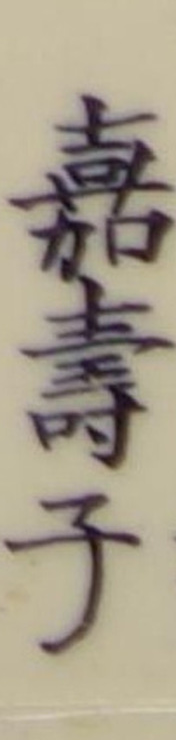嘉壽子
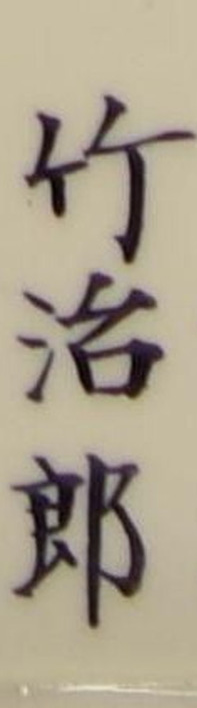竹治郎
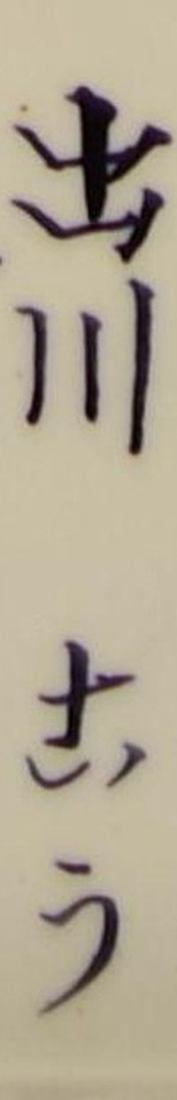出川こう
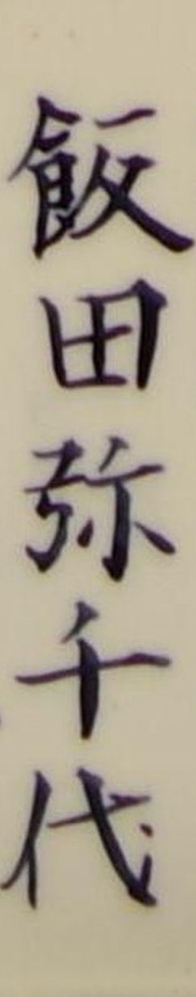飯田弥千代
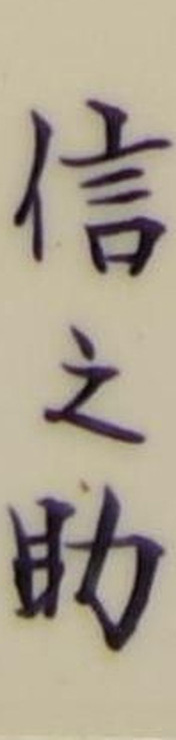信之助
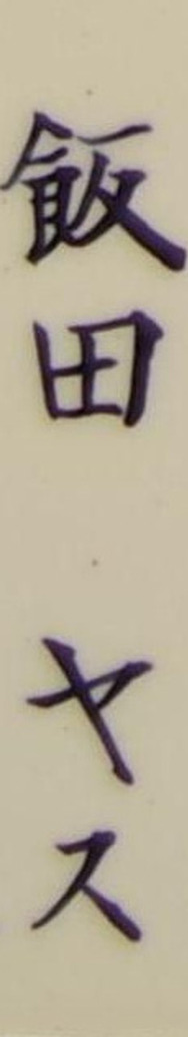飯田ヤス

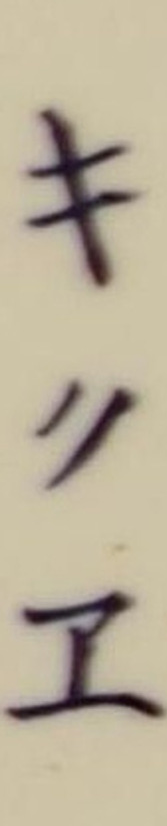キクエ
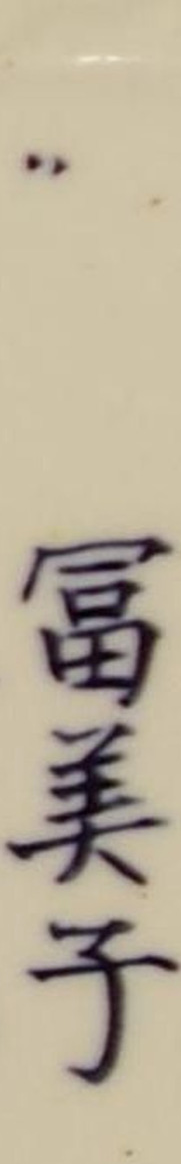冨美子
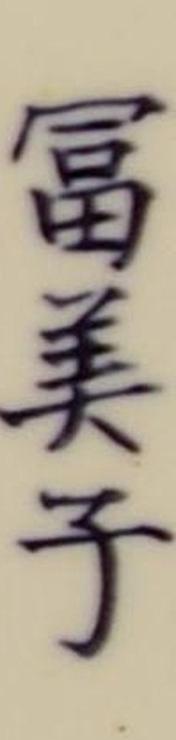冨美子
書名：A~D
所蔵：koyasan kongobuji
